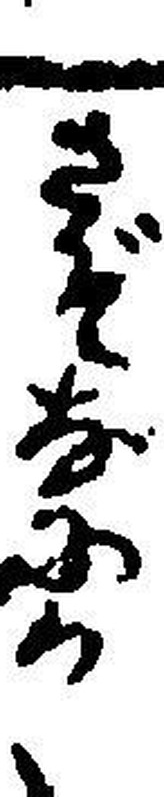さぞなにか
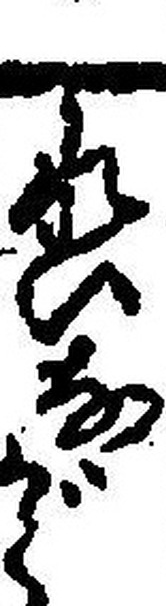れいながら
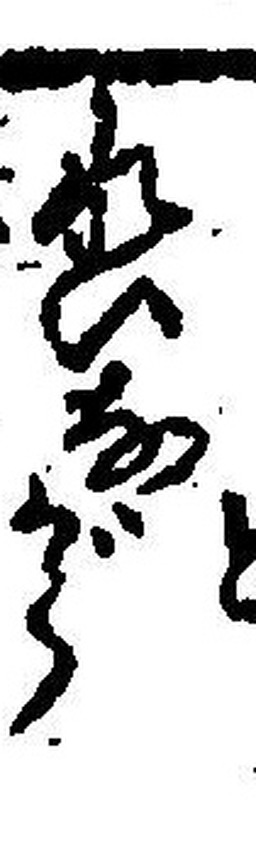れいながら
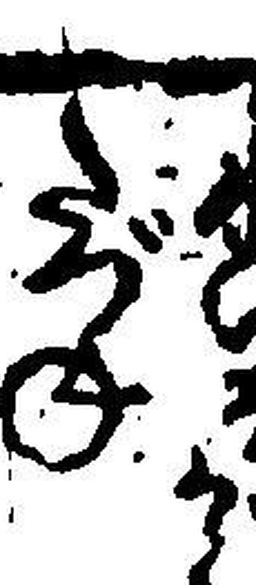たづね

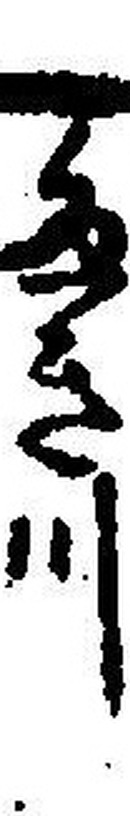たき川
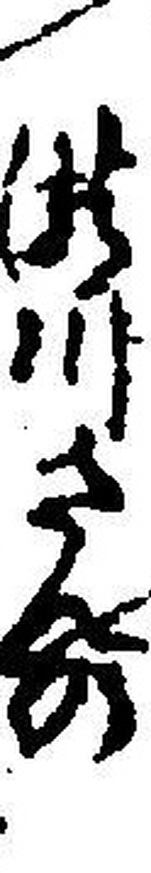滝川さんの
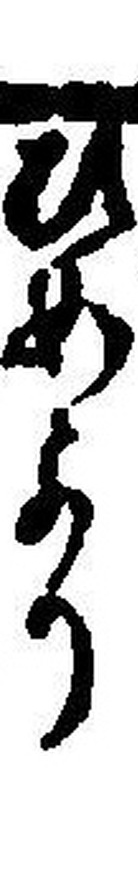ひめより
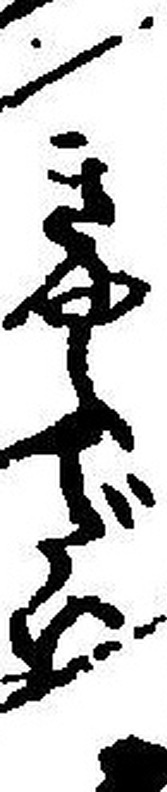きやふだい
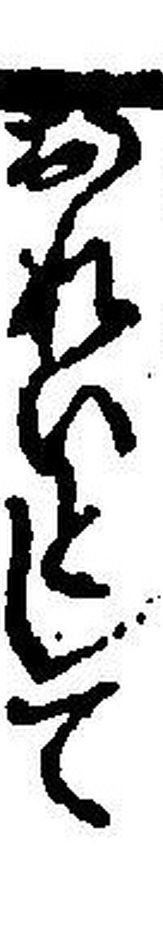おれいとして
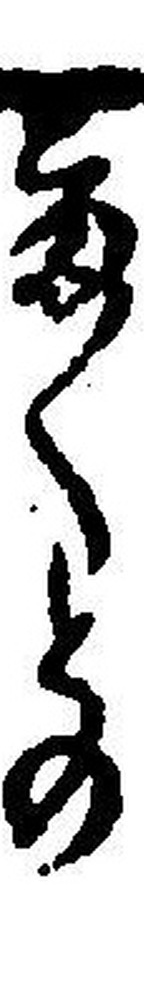こま〳〵との
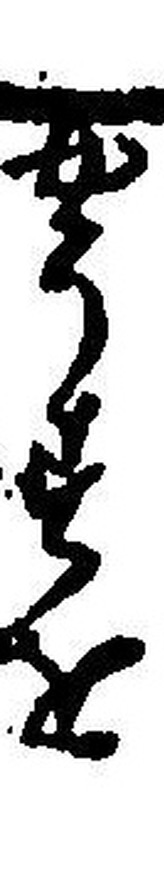やうすを
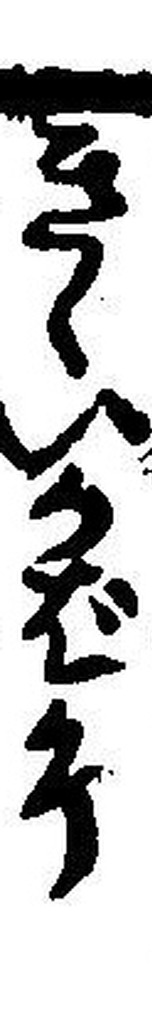きゝいかばかり
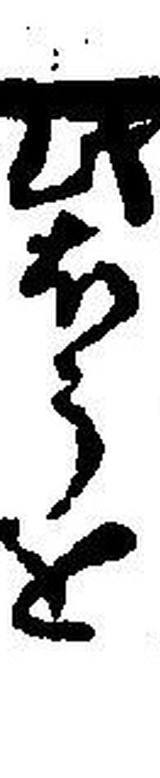此ほうを
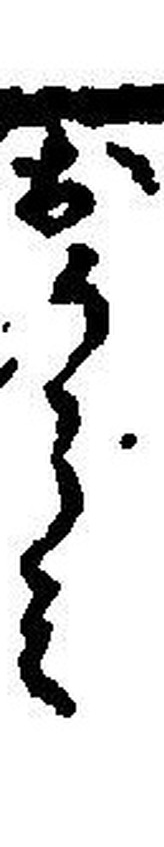おうらみ
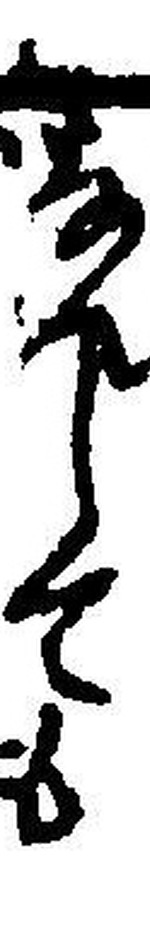なんしても
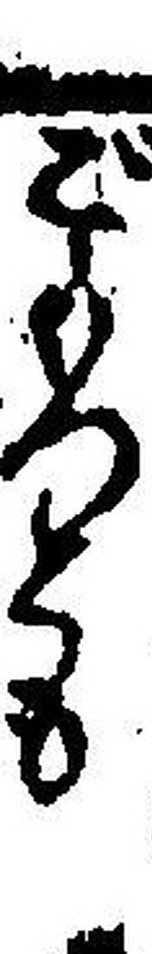ごもつとも
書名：御代参牛時詣 / 市場通笑作
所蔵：東京大学総合図書館 General Library in the University of Tokyo, JAPAN
